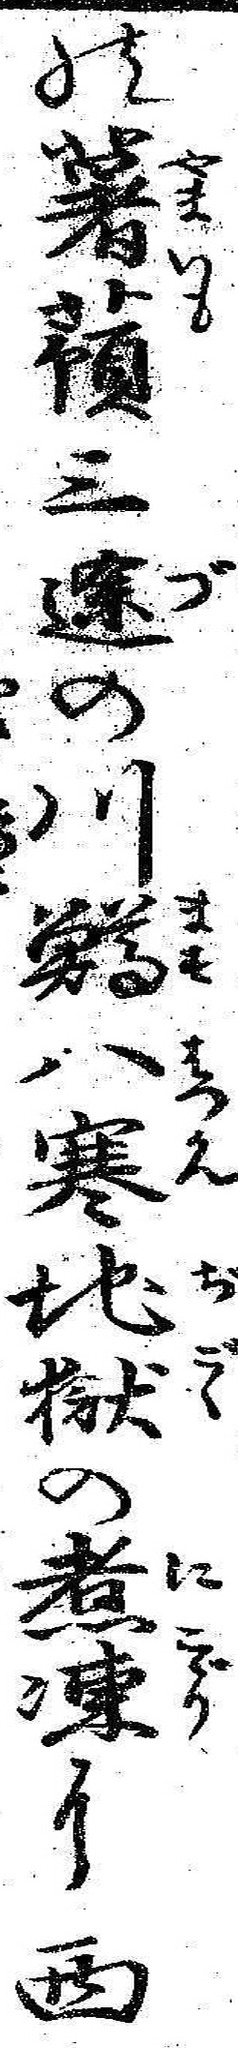の薯蕷三途の川鱒八寒地獄の煮凍に西
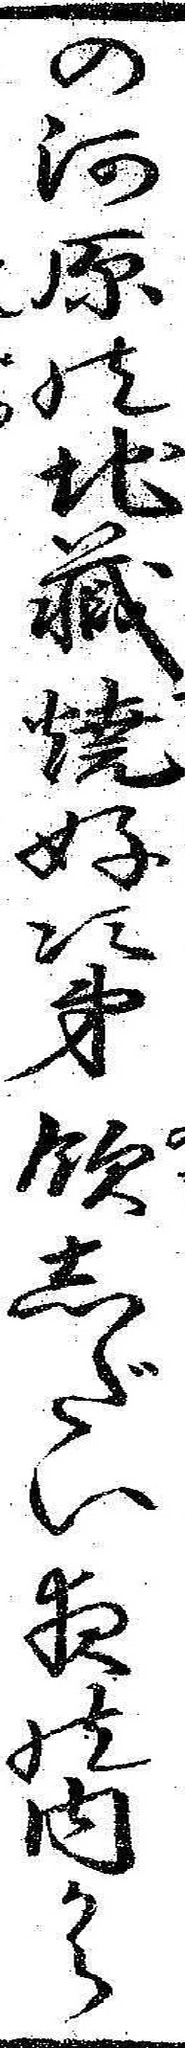の河原の地蔵焼好次弟飲しだい夜の内から
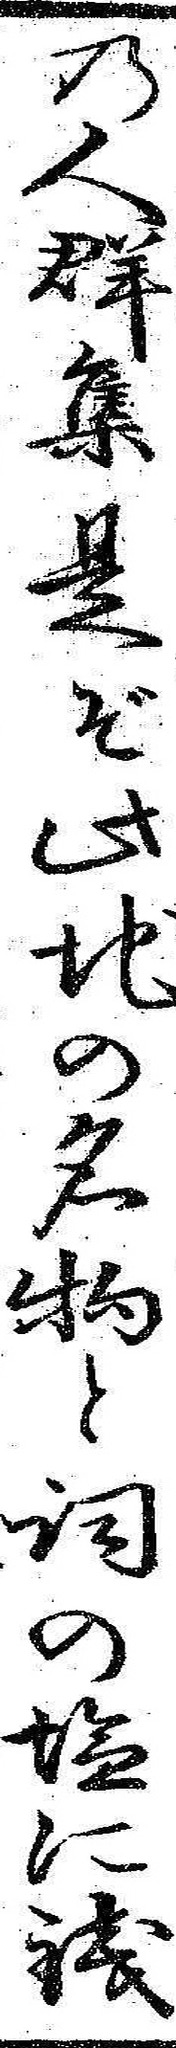の人群集是ぞ此地の名物と詞の塩に銭
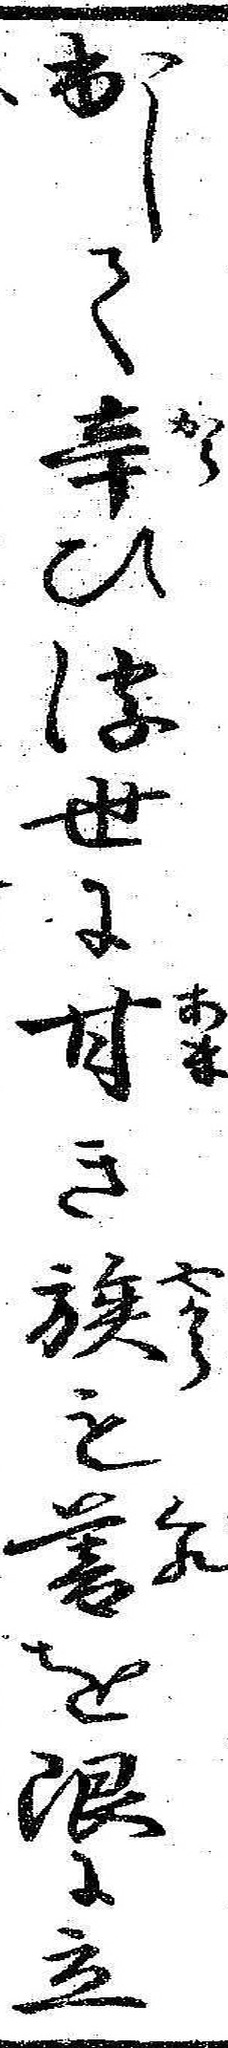出して辛ひ浮世に甘き族も暮を限に立
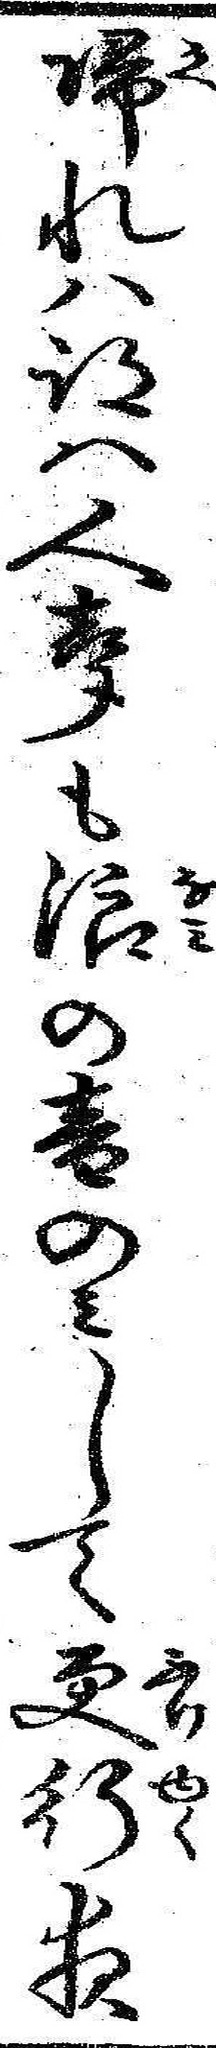帰れは跡は人声も浪の音のみして更行夜
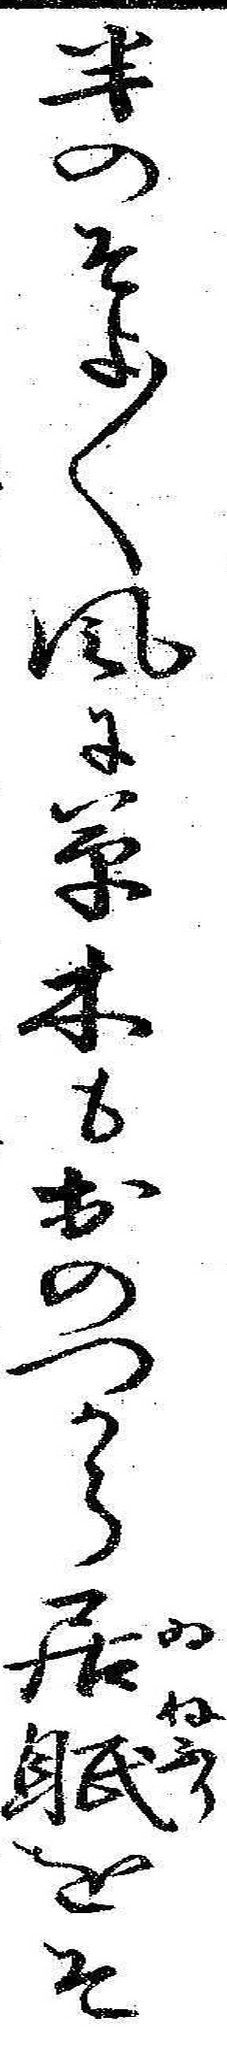半のそよ〱風に草木もおのつから居眠をそ
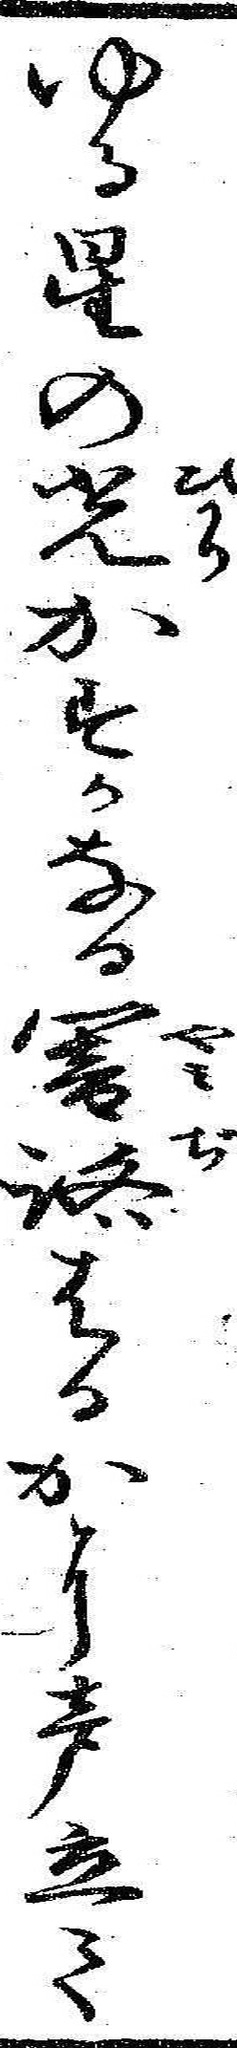ゆる星の光かすかなる闇路はるかに声立て
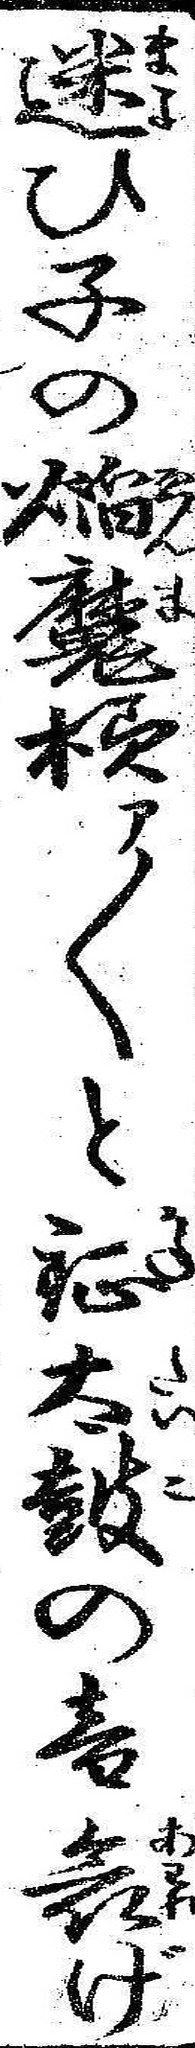迷ひ子の焔魔様ァ〱と証太鼓の音哀げ
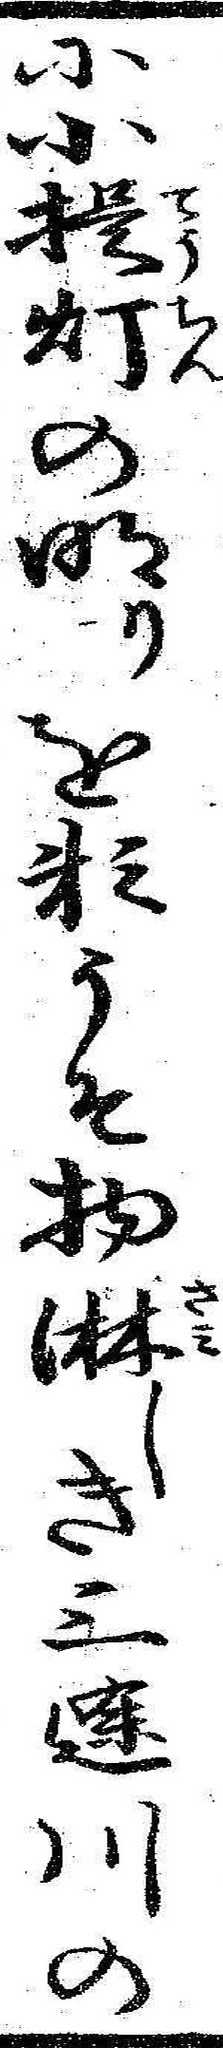に小提灯の明頼うそ物淋しき三途川の
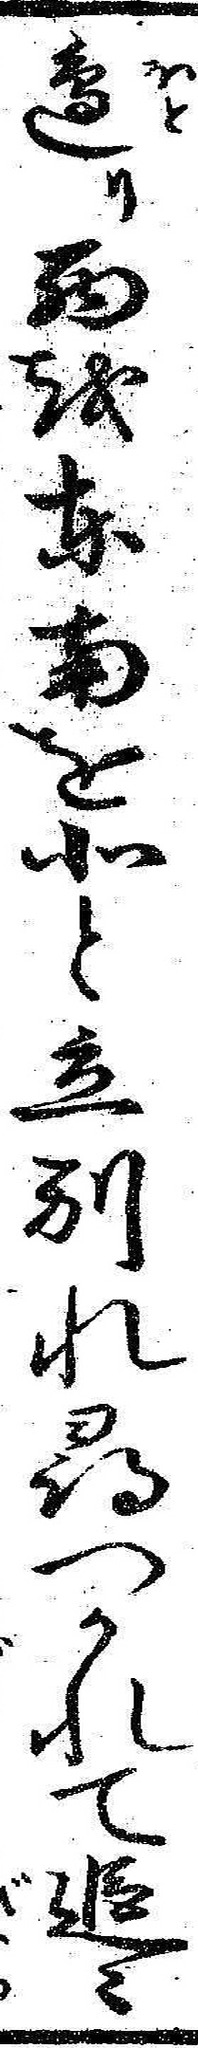辺西を東南を北と立別れ尋つかれて追々
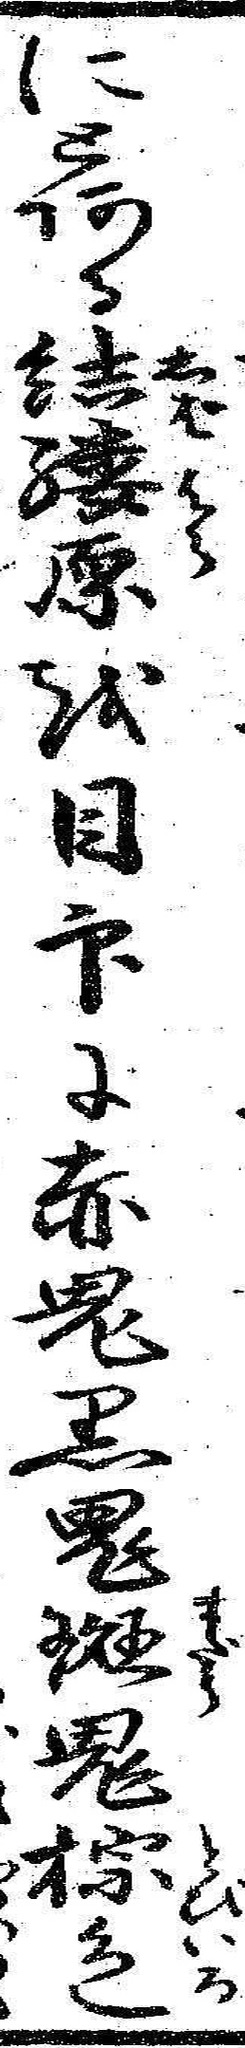にとある結縷原を目印に赤鬼黒鬼斑鬼棕色
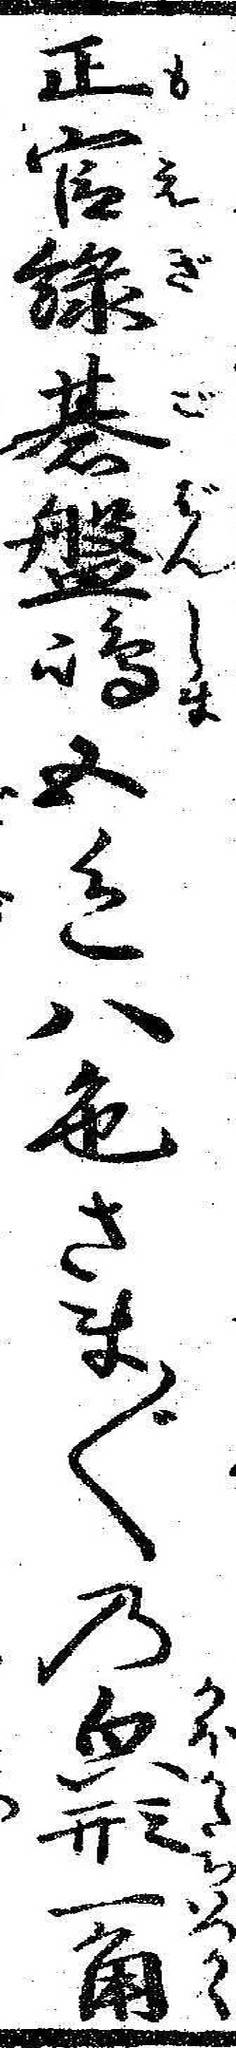正官緑碁盤島五色八色さま〴〵の貌形一角
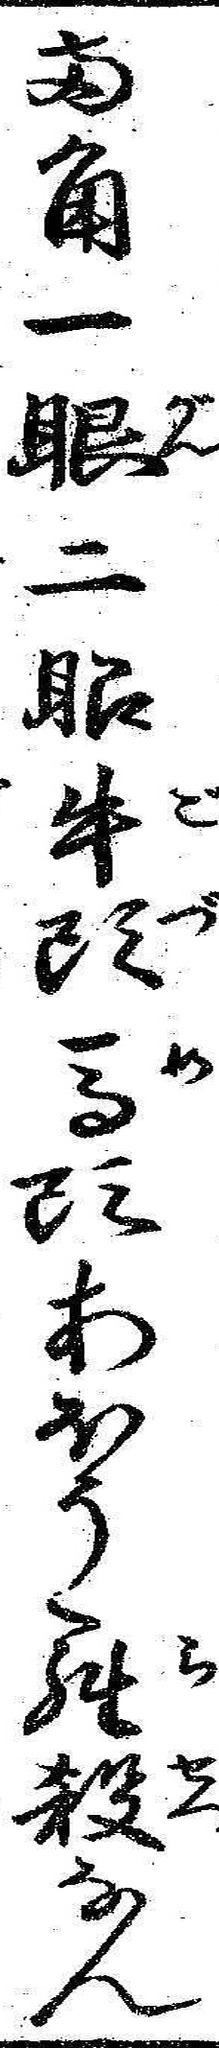両角一眼二眼牛頭馬頭あほう羅殺なん
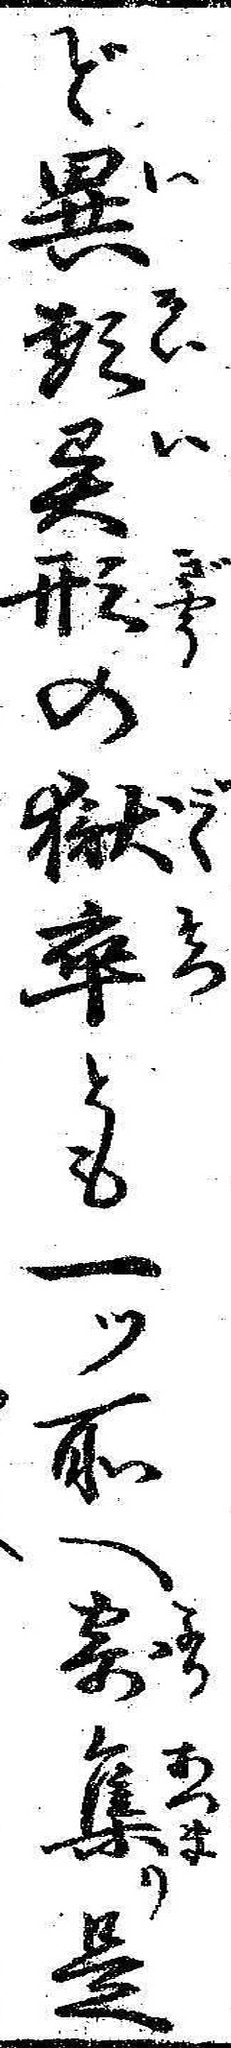ど異類異形の獄卒とも一ッ所へ寄集是
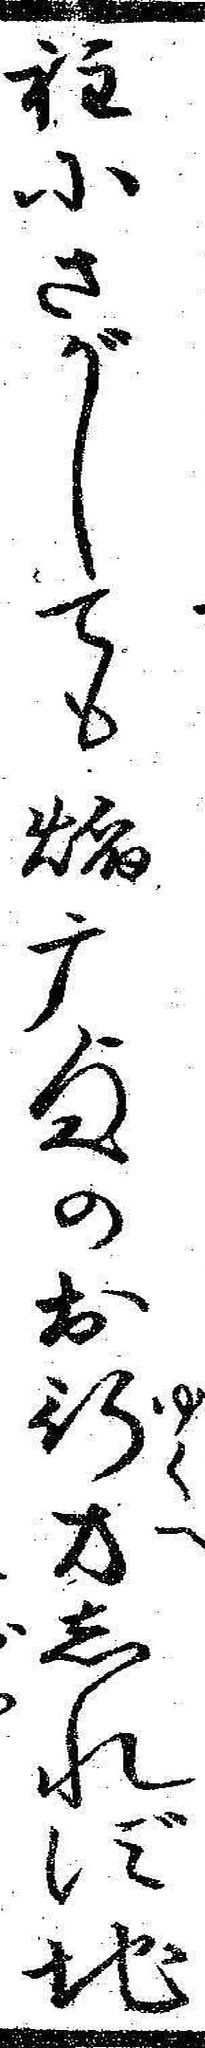程にさがしても焔魔様のお行方しれず地
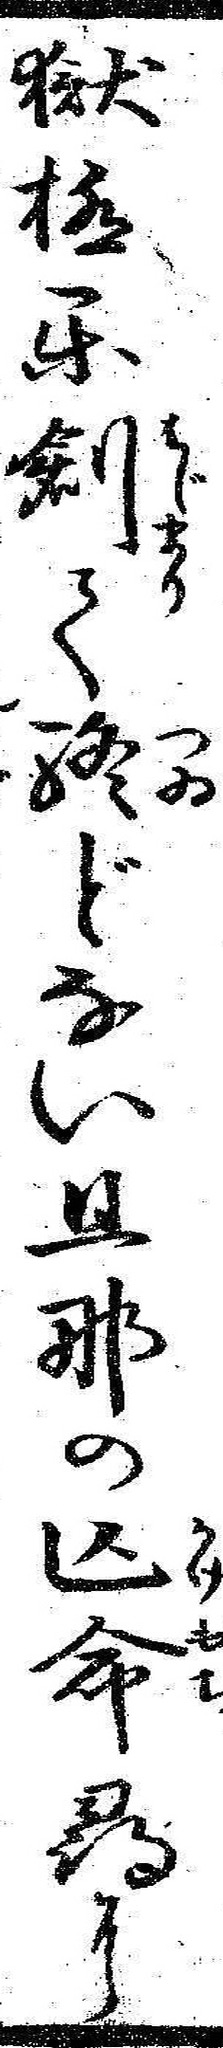獄極楽創て終どない且那の亡命尋に
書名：根無草後編
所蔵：国文学研究資料館
